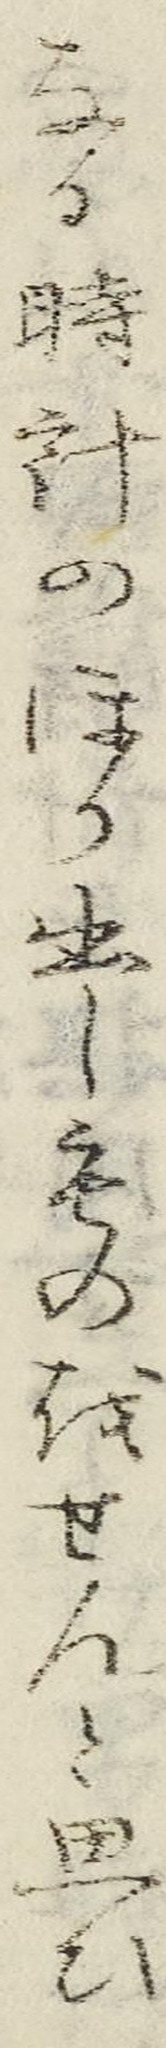なる時計のほり出しものをせんと思ひ
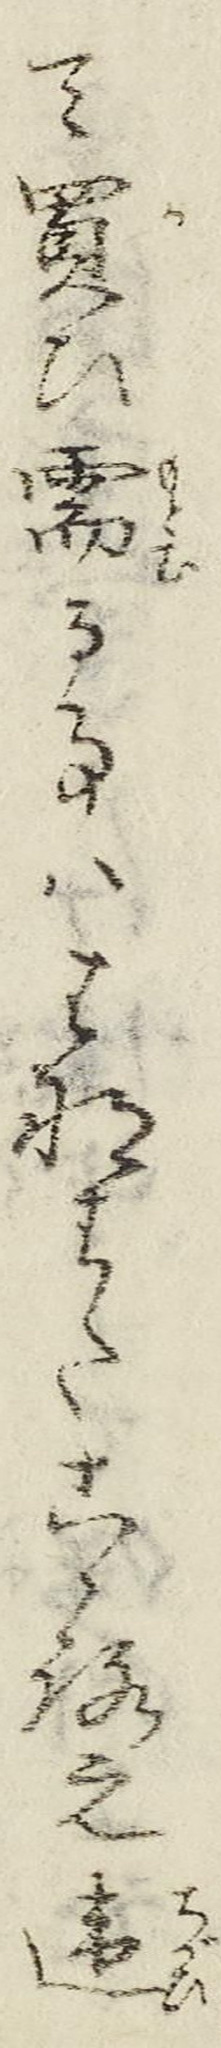て買ひ需る事ははなはたこころえ違
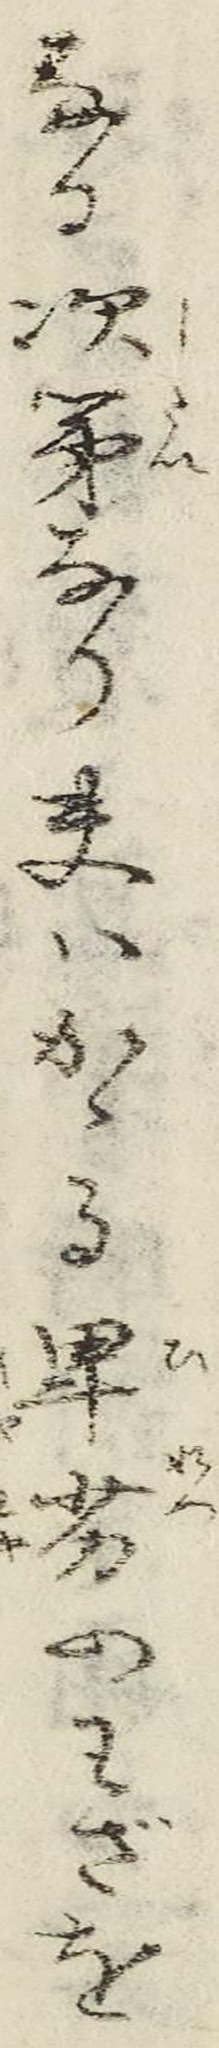なる次第なり夫はかゝる卑劣のわざを
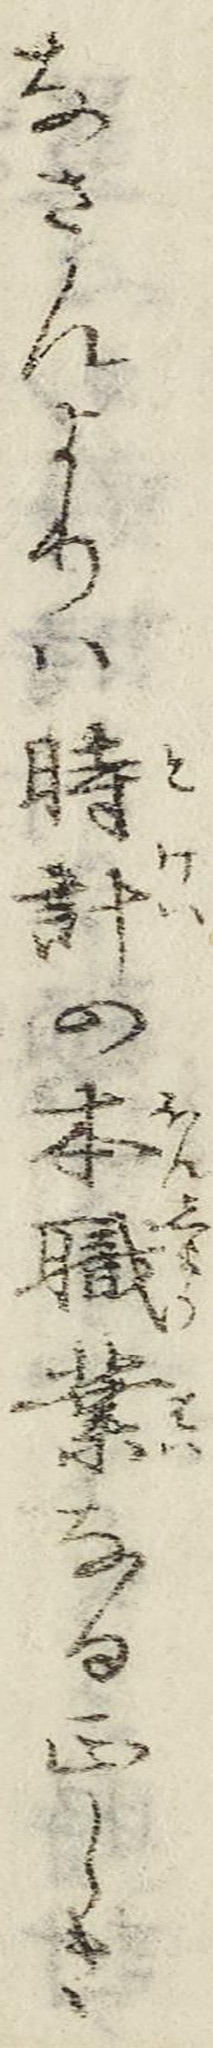なさんよりは時計の本職業なる正しき
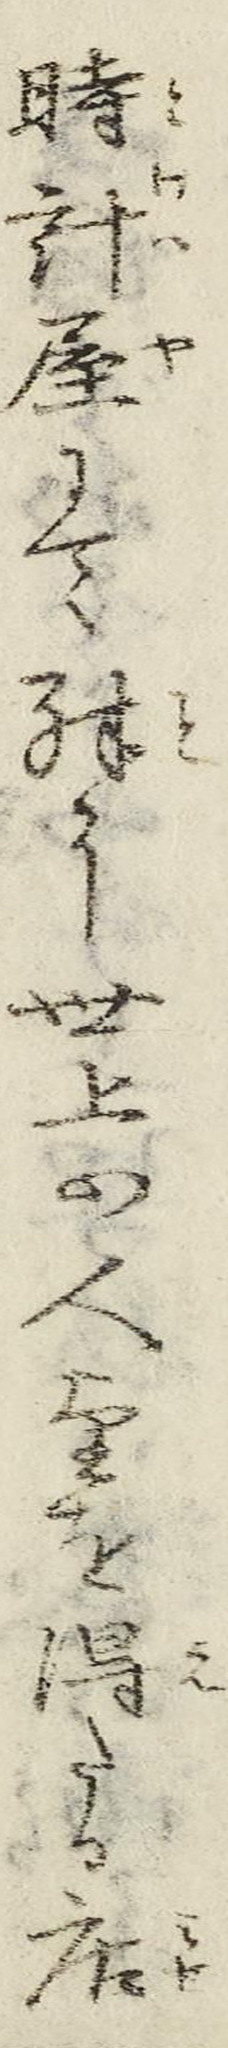時計屋にて殊に世上の人望を得たる店
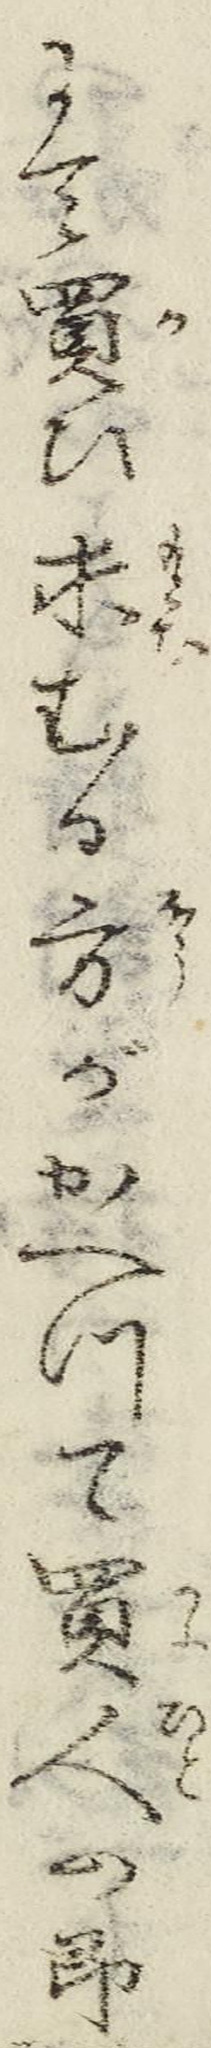にて買ひ求むる方がかへつて買人の即
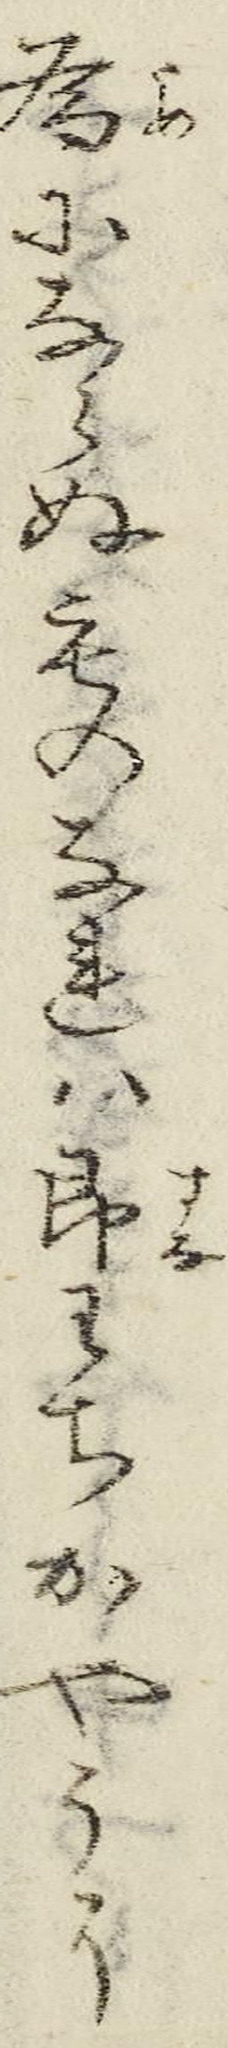為にならぬものなれは即わちかやうに
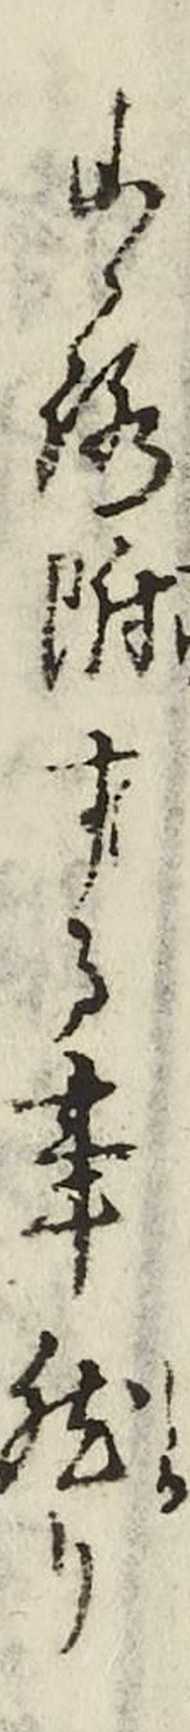こころ附する事然り
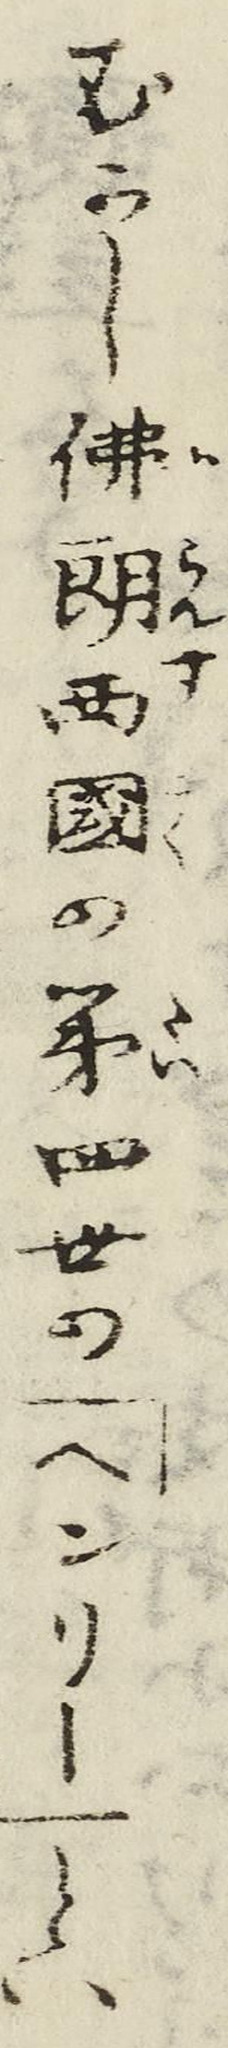むかし佛朗西国の第四世の「ヘンリー」とい
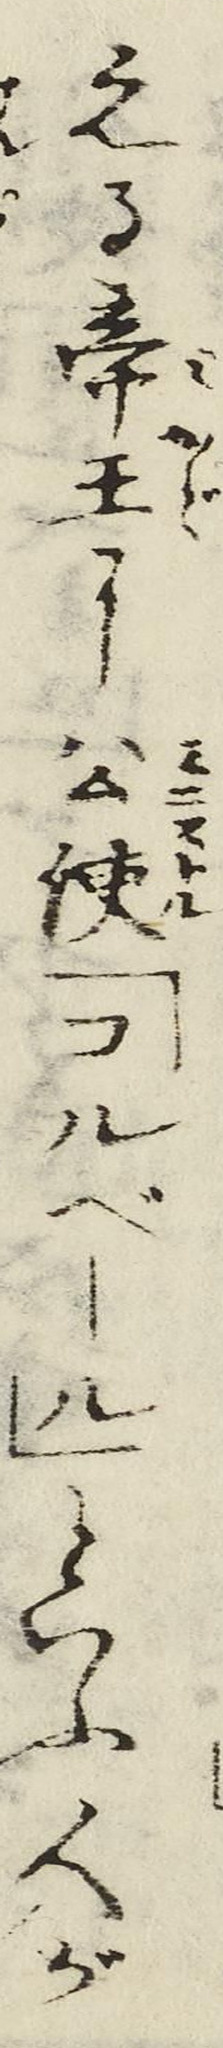える帝王に公使「コルベール」といふ人が
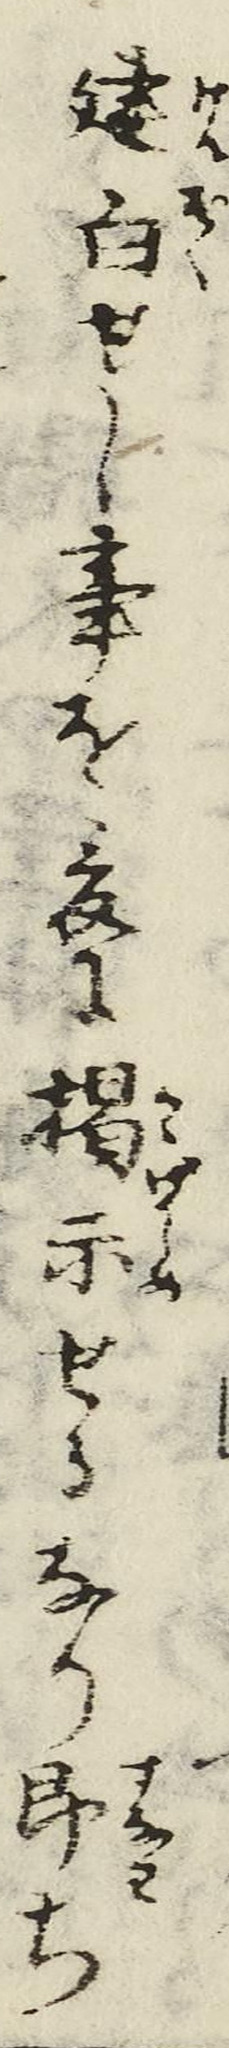建白せし事を爰に掲示せるなり即ち
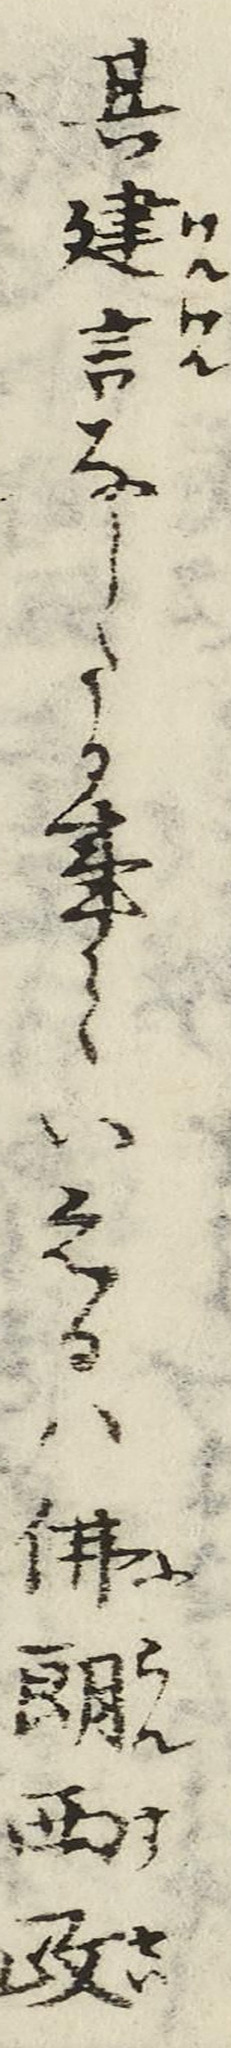其建言なしたる事といえるは佛朗西政
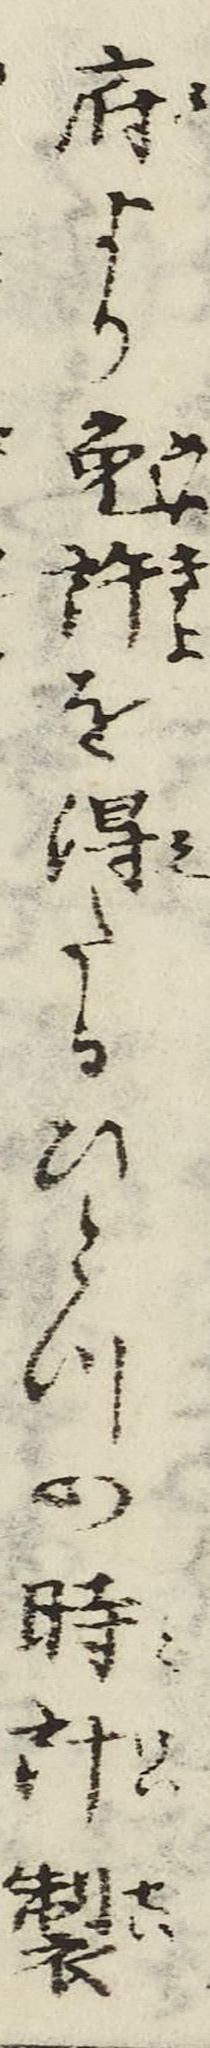府より免許を得たるひとつの時計製
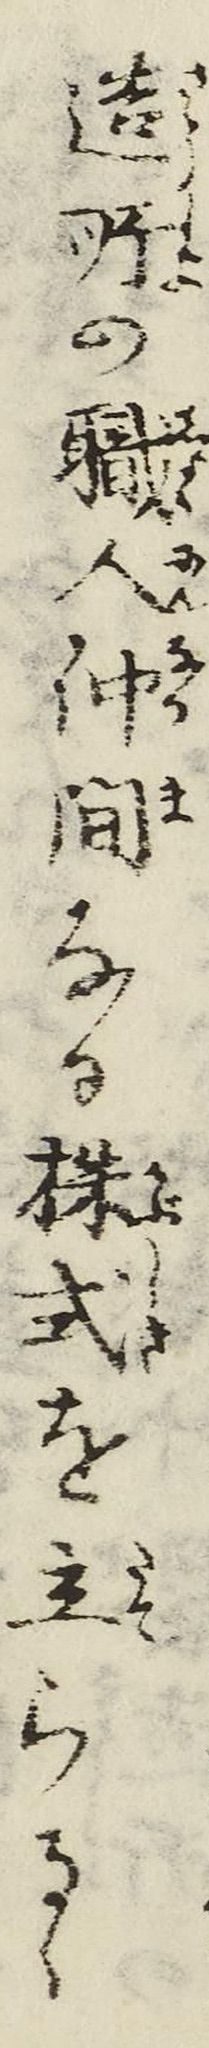造所の職人仲間なる株式を立らるゝ
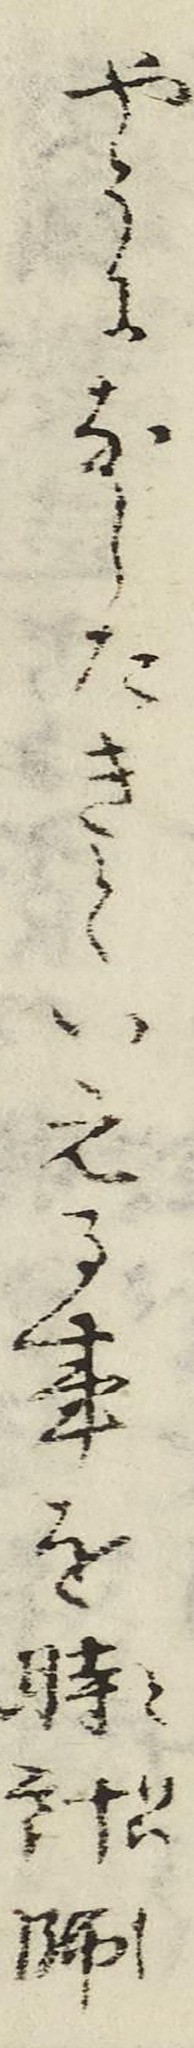やうになしたきといえる事を時計師
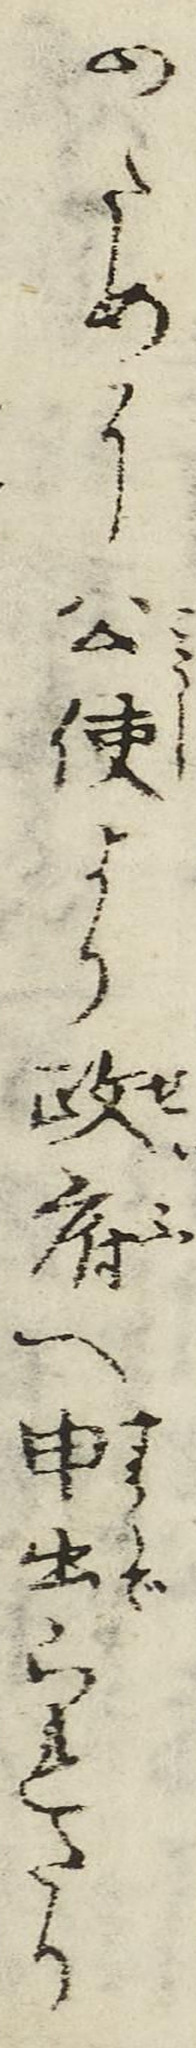のために公使より政府へ申出られたり
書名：[時計に関する冊子]
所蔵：東京大学地震研究所図書室 Earthquake Research Institute Library, The University of Tokyo, JAPAN
